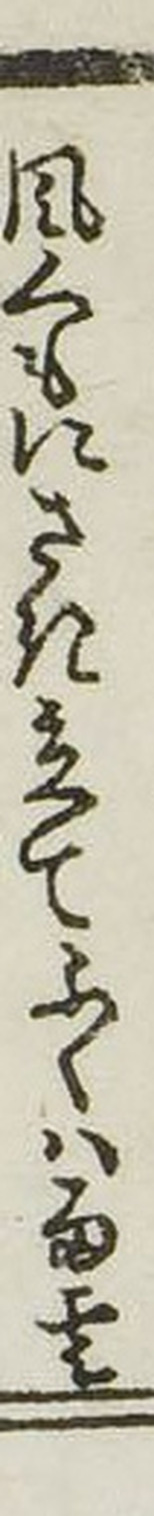風くもにさき立てふくは雨雲
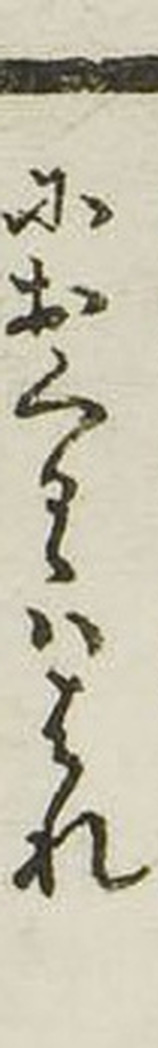におくるゝははれ
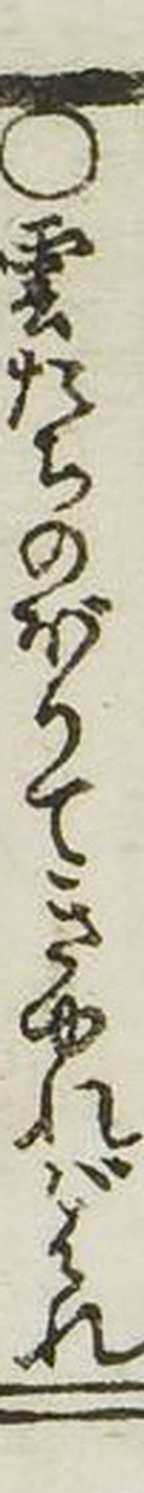○雲たちのぼりてきゆればはれ
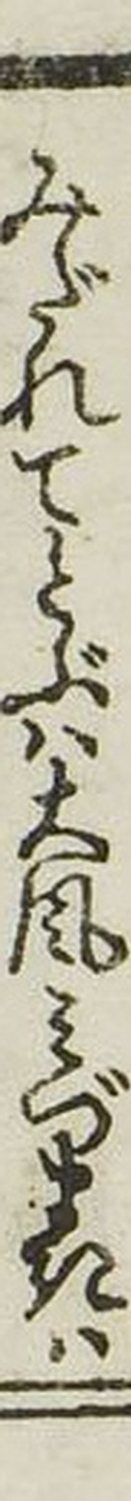みだれてとぶは大風みづまきは
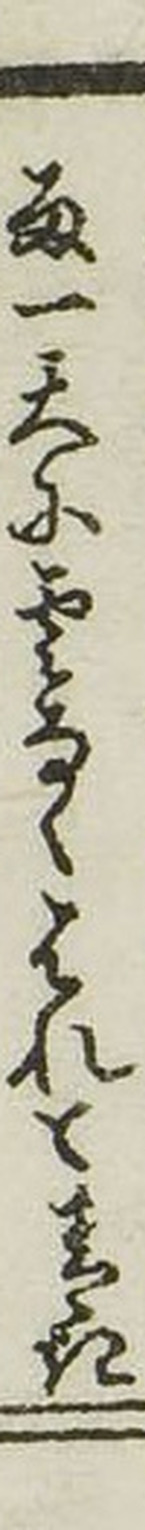雨一天に雲なくはれて青き
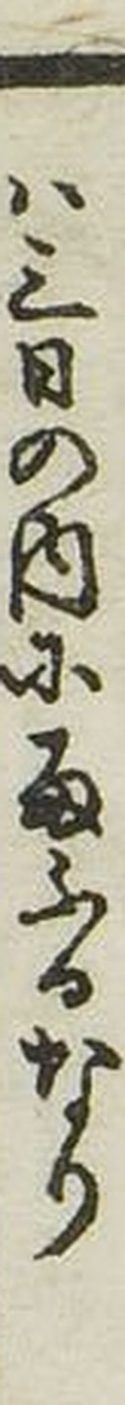は三日の内に雨ふるなり

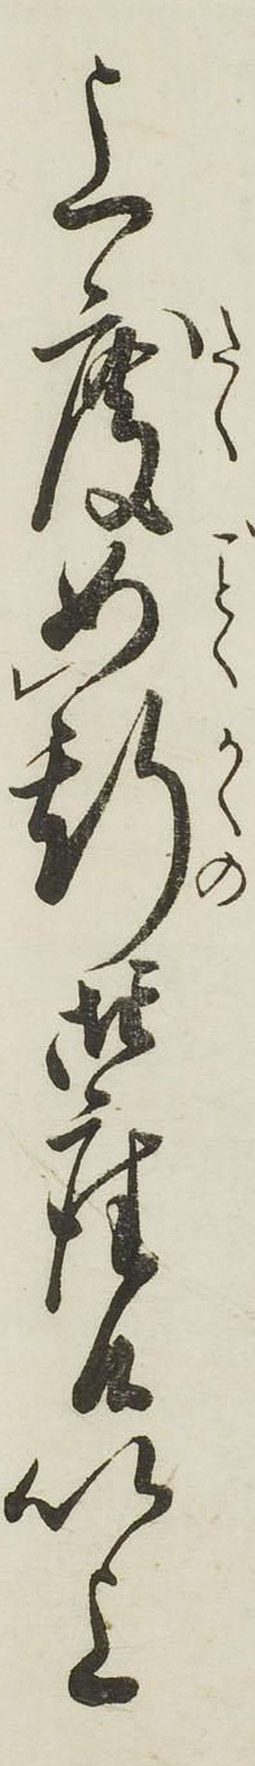上度如斯御座候以上
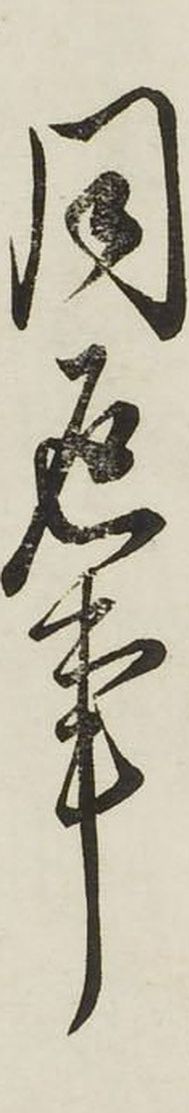同返事
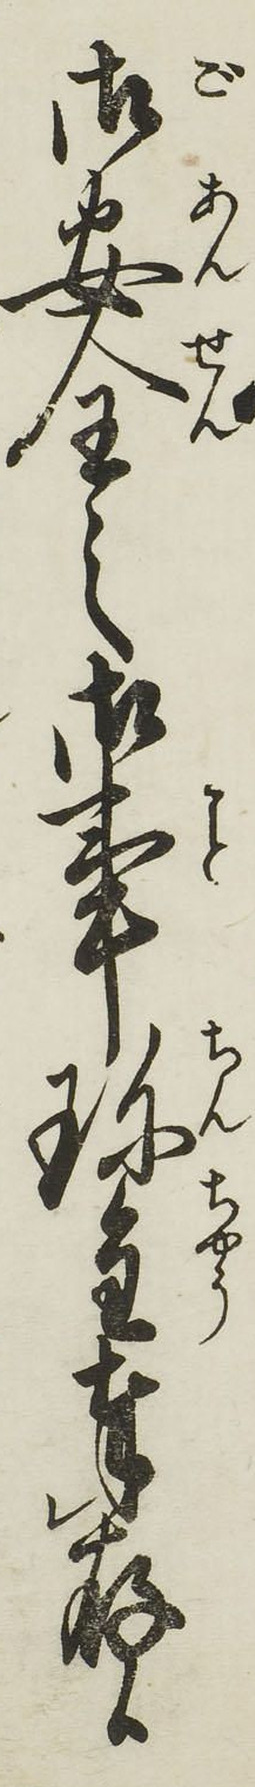御安全之御事珍重奉存候
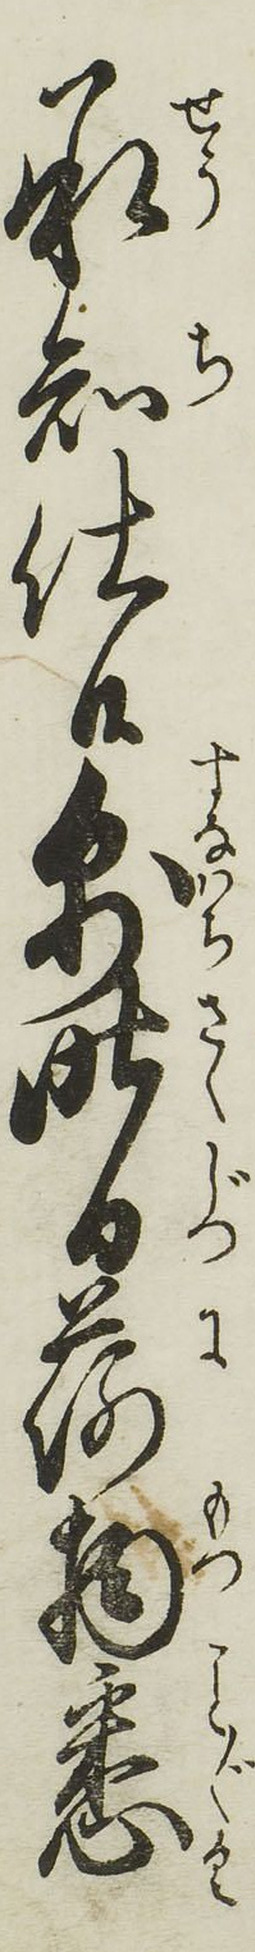承知仕候則昨日荷物悉

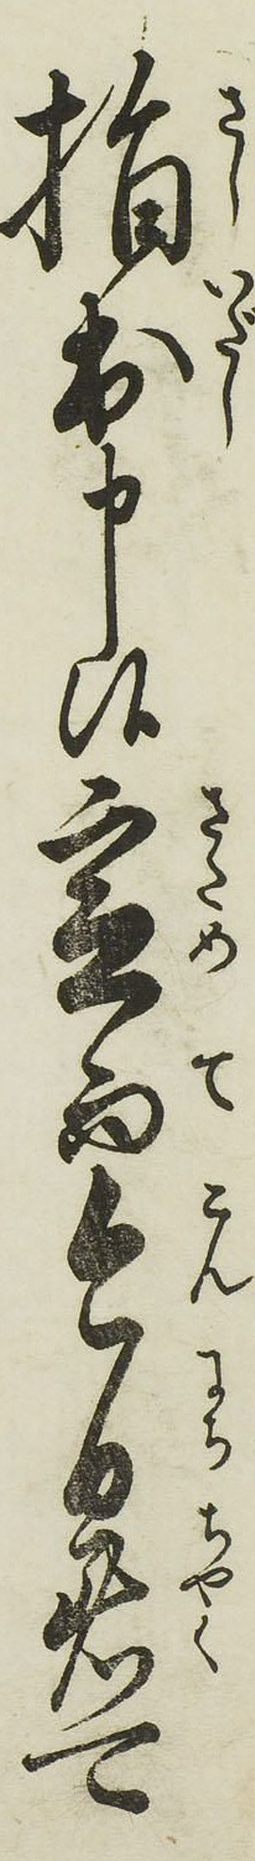指出申候定而今日着可
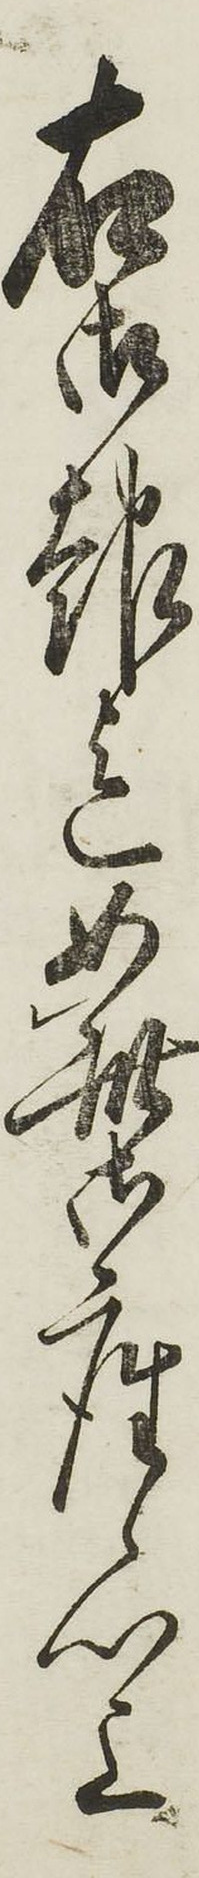右御報迄如此御座候以上
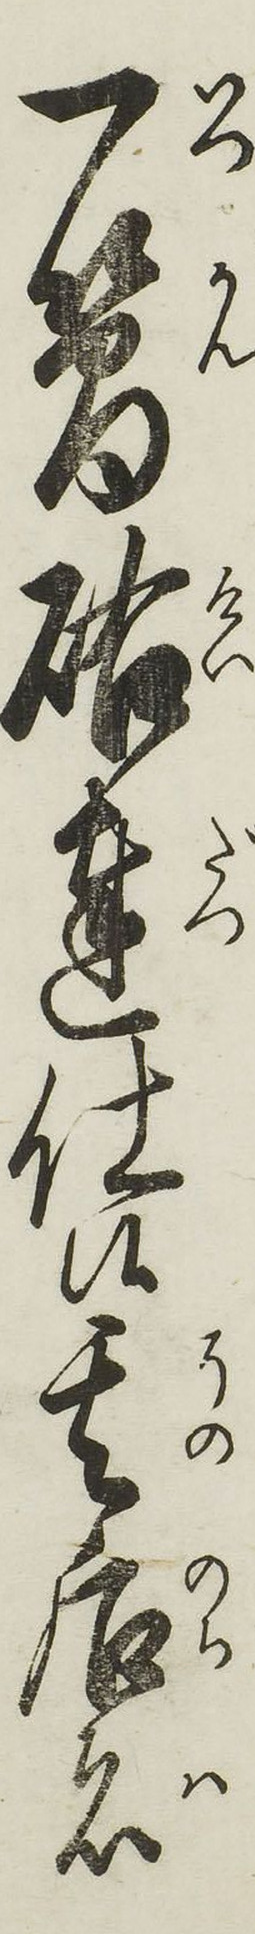一簡啓達仕候其后者

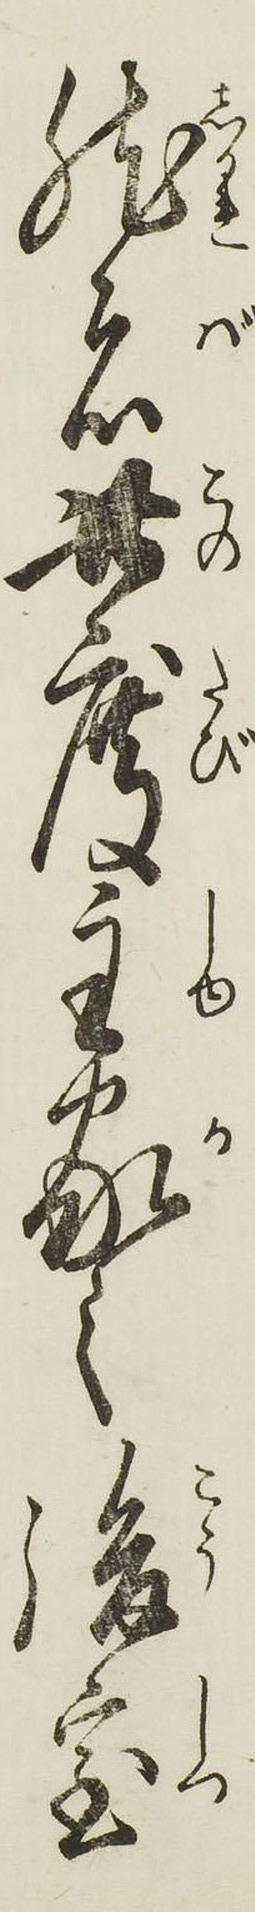然者此度主家之後室
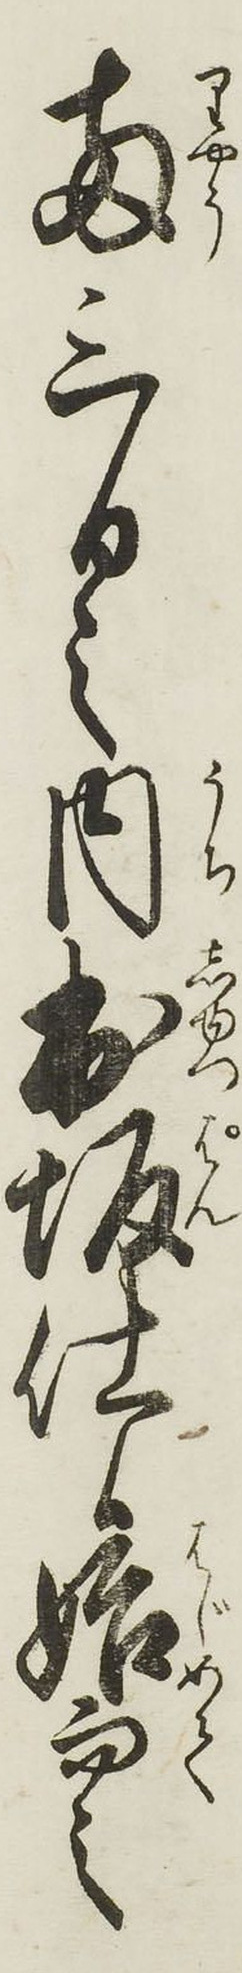両三日之内出坂仕候始而之
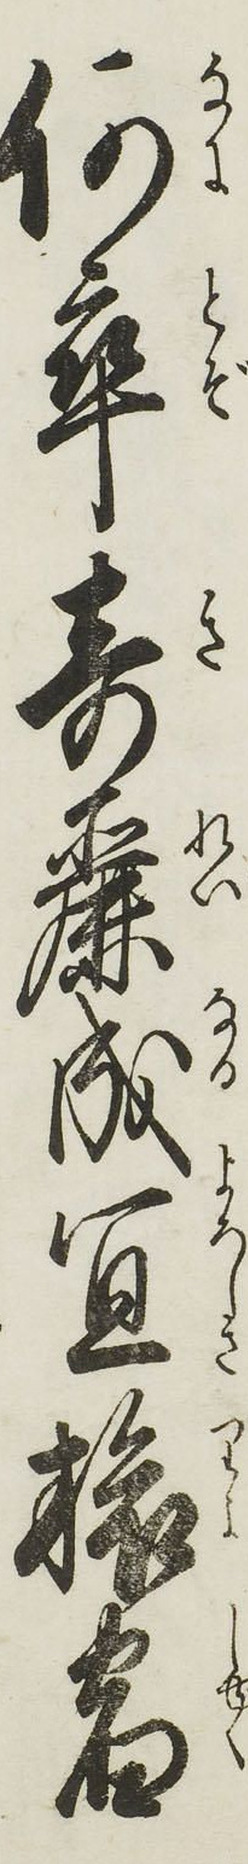何卒奇麗成宜旅宿
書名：商人書翰便覧
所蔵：東京学芸大学教育コンテンツアーカイブ
